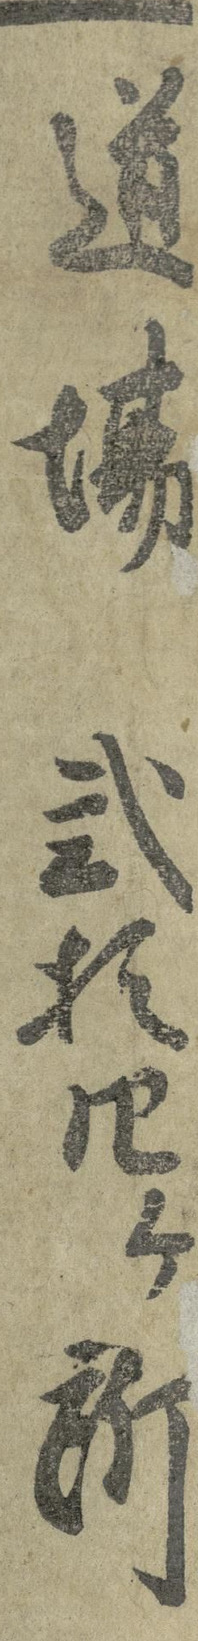道場弐拾四ケ所
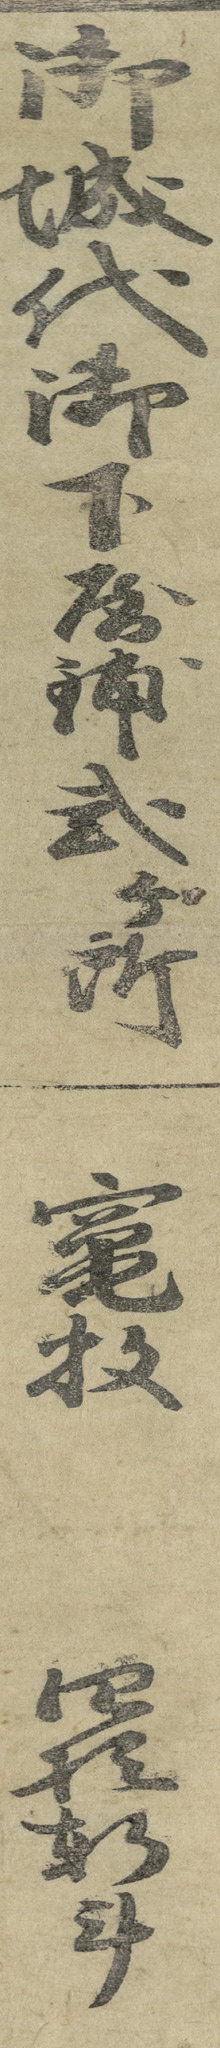御城代御下屋敷弐ケ所竃数四拾軒計
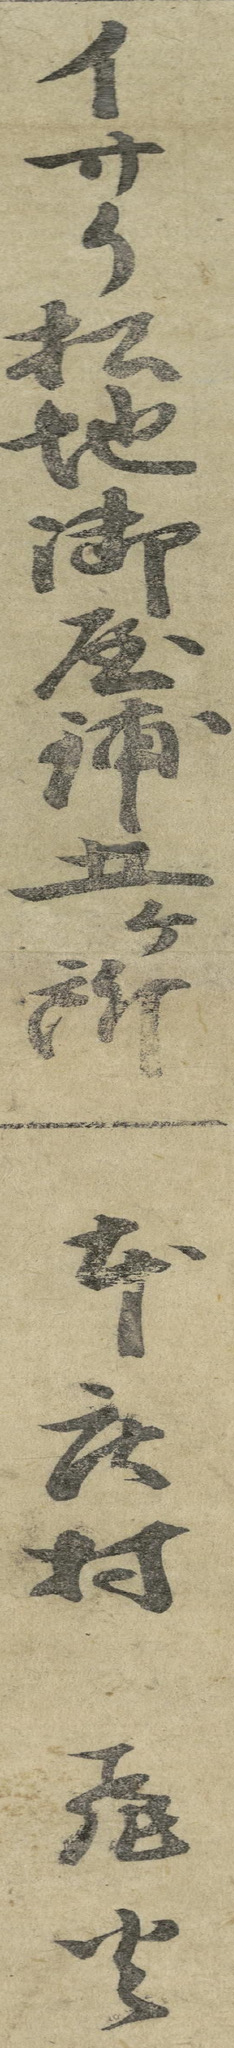イナリ松地御屋敷五ケ所本庄村飛火
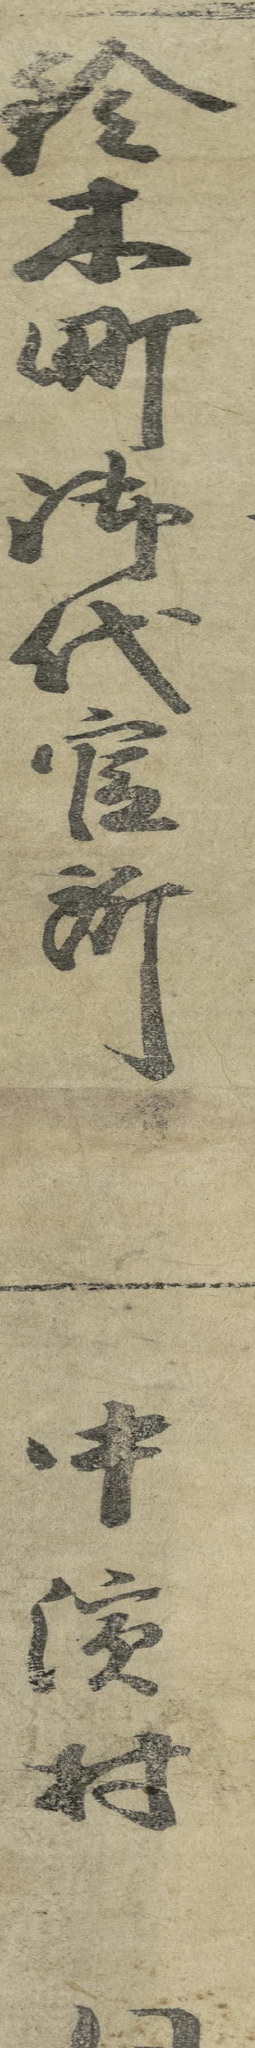鈴木町御代官所中濱村同
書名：大阪大火家數本しらべ
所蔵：東京大学地震研究所図書室 Earthquake Research Institute Library, The University of Tokyo, JAPAN
